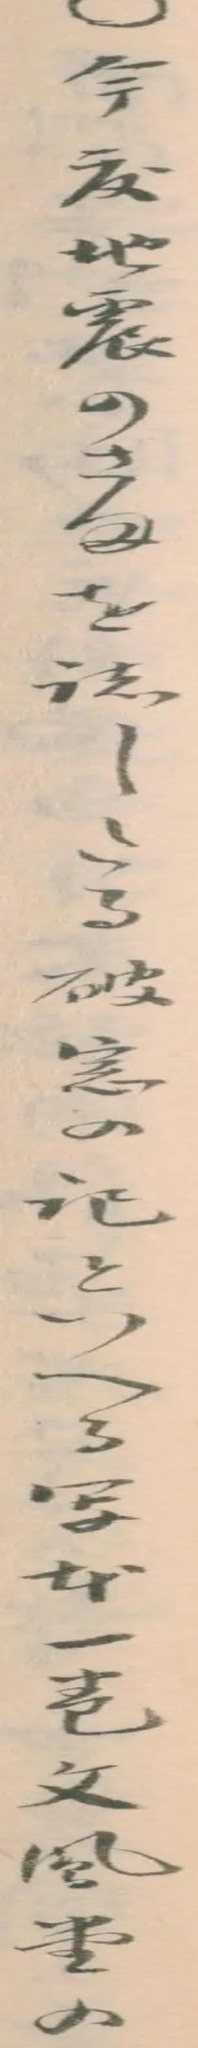〇今度地震のさまを誌したる破窓の記といへる写本一巻文鳳堂の
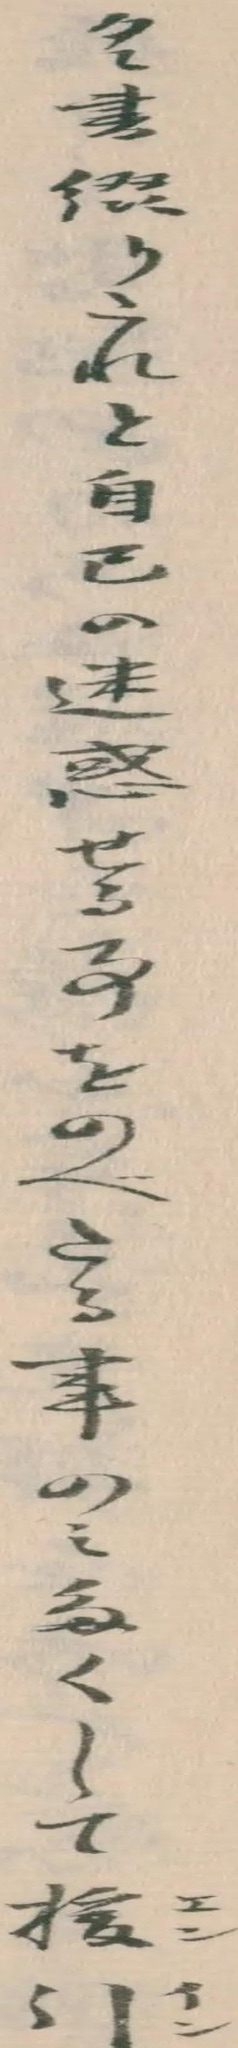く書綴りこれと自己の迷惑せる事をのべたる事のみ多くして援引
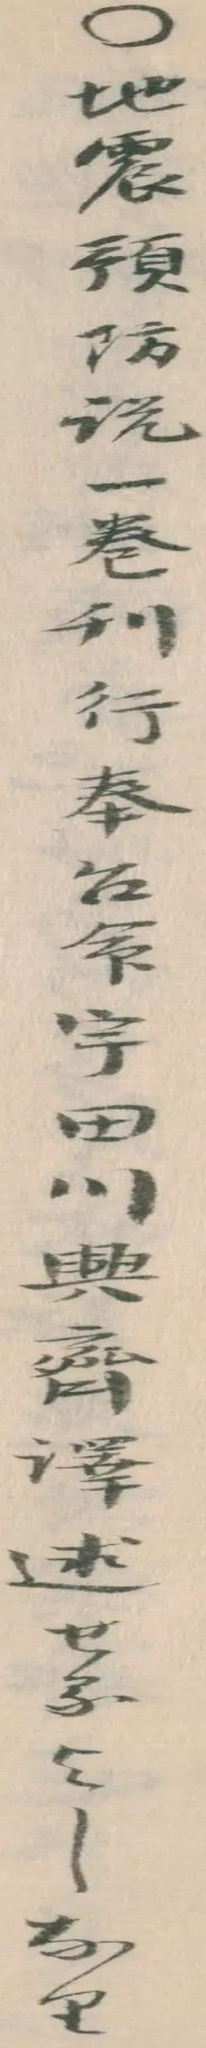〇地震預防説一巻刊行奉台命宇田川興齊訳述せるよしなり
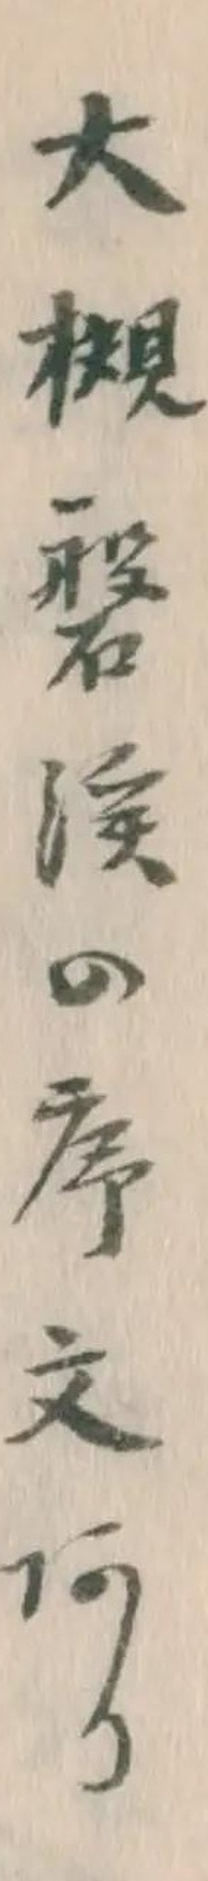大槻磐渓の序文あり
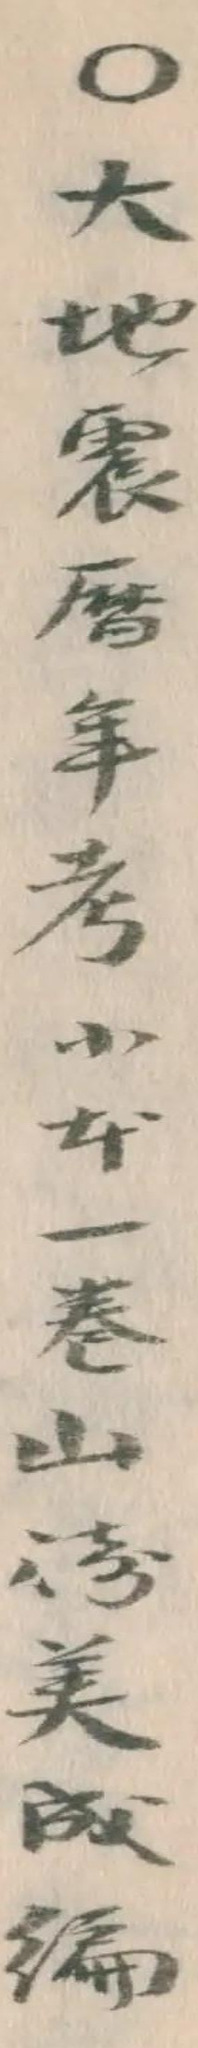〇大地震暦年考小本一巻山崎美成編
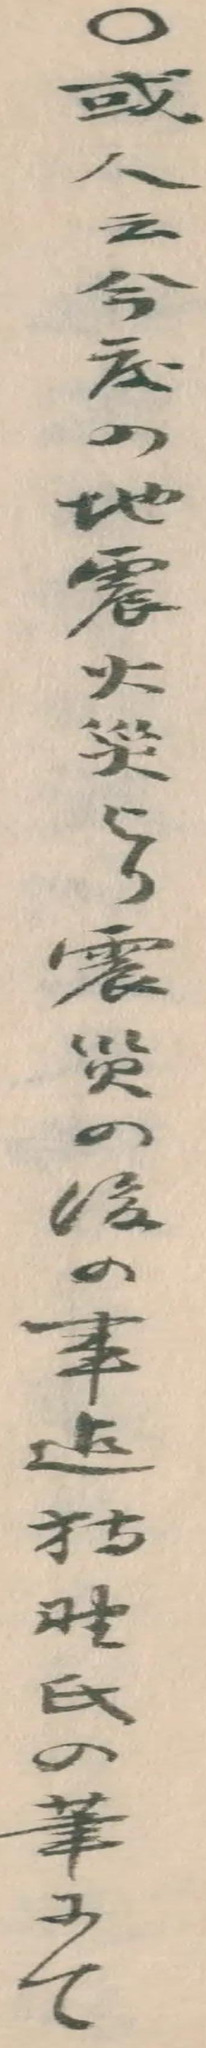〇或人云今度の地震火災より震災の後の事迄持野氏の筆にて
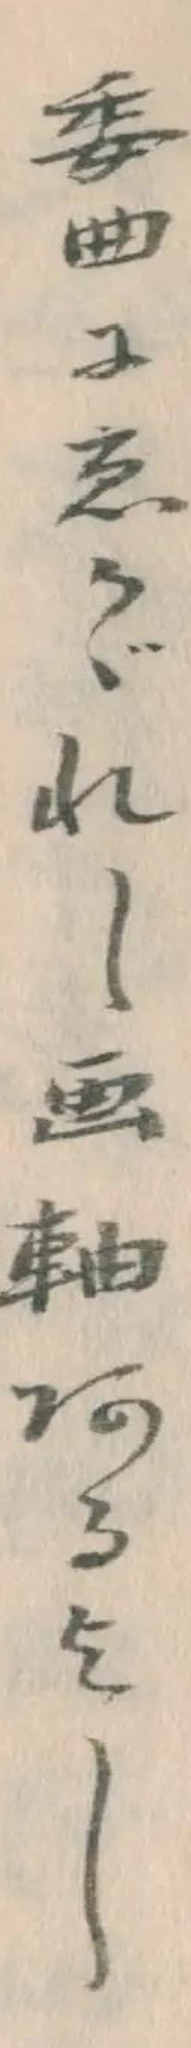委曲にゑかゞれし画軸あるよし

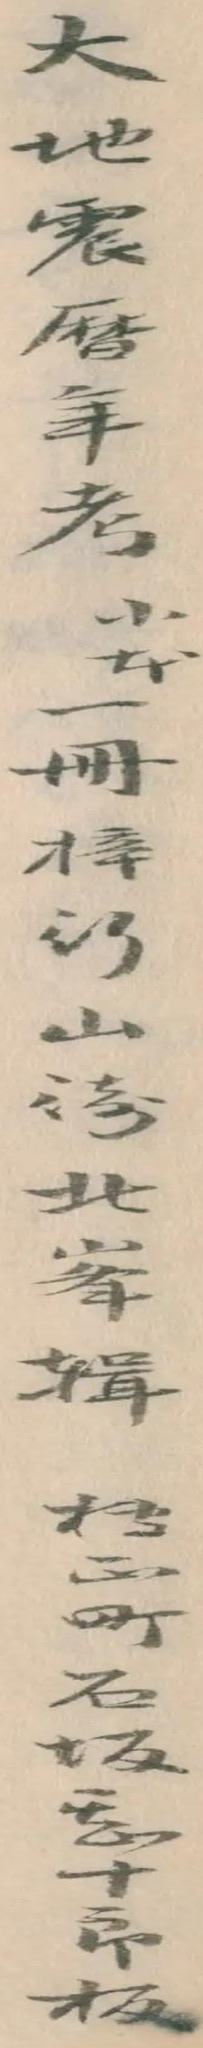大地震暦年考小本一冊梓行山崎北峯輯榑正町石坂甚十郎板
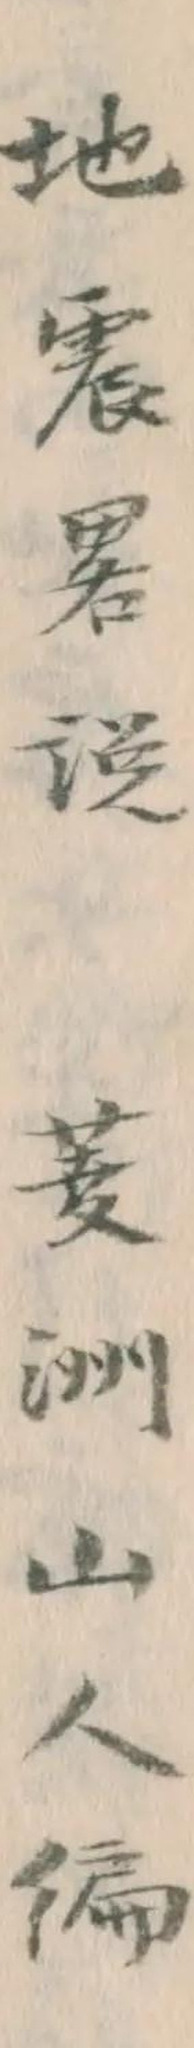地震略説菱洲山人編
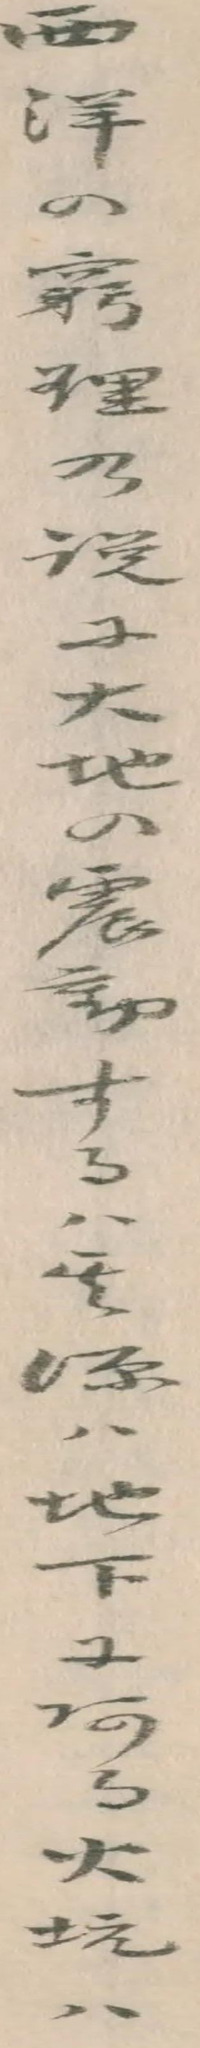西洋の窮理の説に大地の震動するは其源は地下にある火坑は
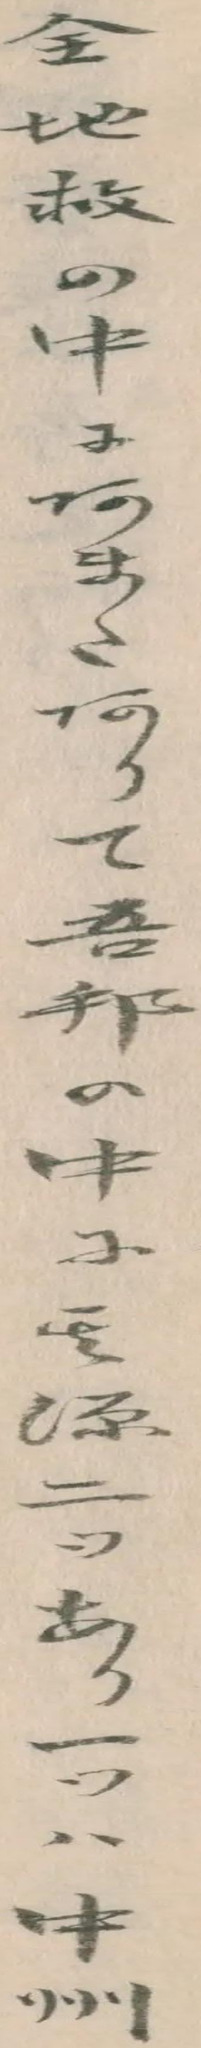全地救の中にあまたありて吾邦の中に其源二ツあり一ツは中州
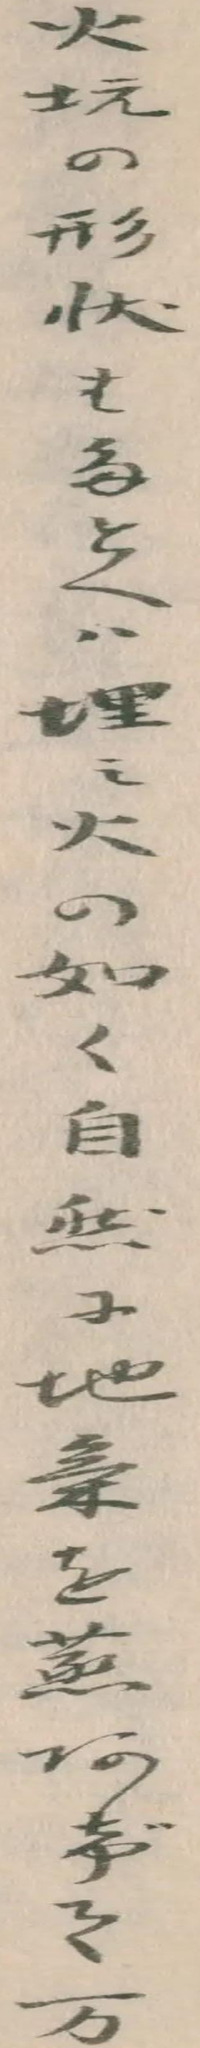火坑の形状はたとへは埋み火の如く自然に地気を蒸あげて万
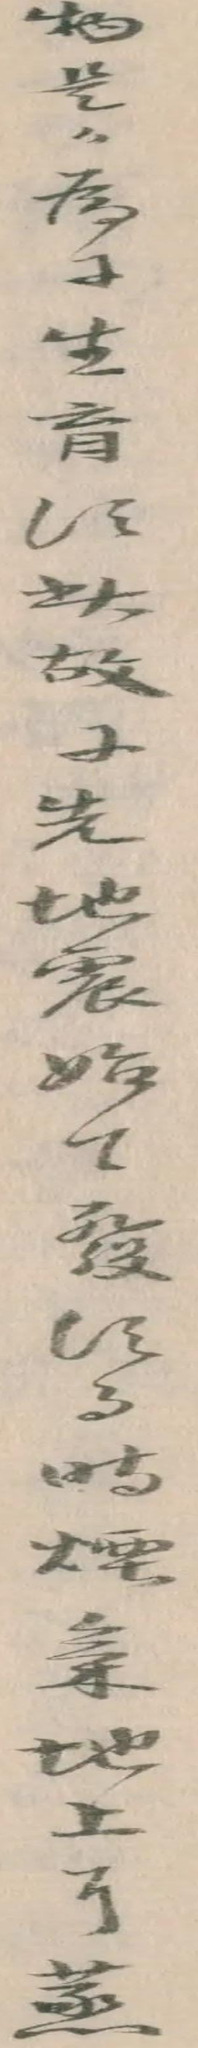物是か為に生育す此故に先地震始て発する時煙気地上に蒸
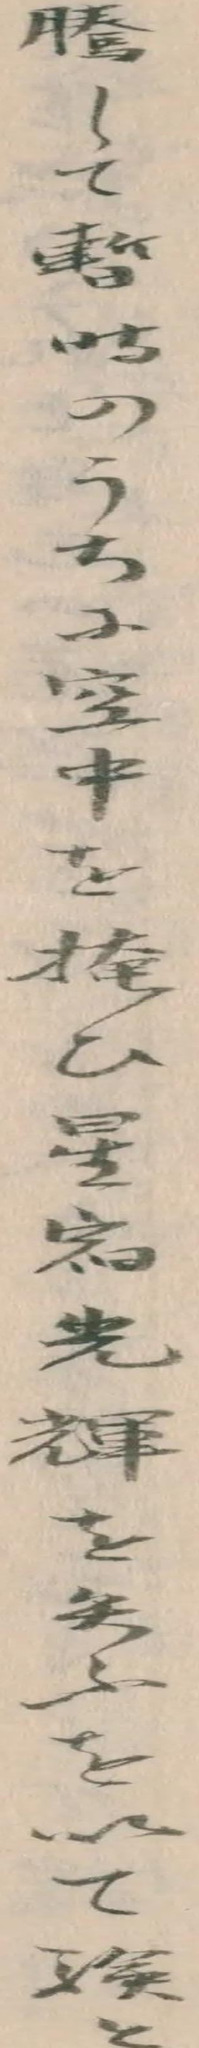騰して暫時のうちに空中を掩ひ星宿光輝を失ふを以て験と
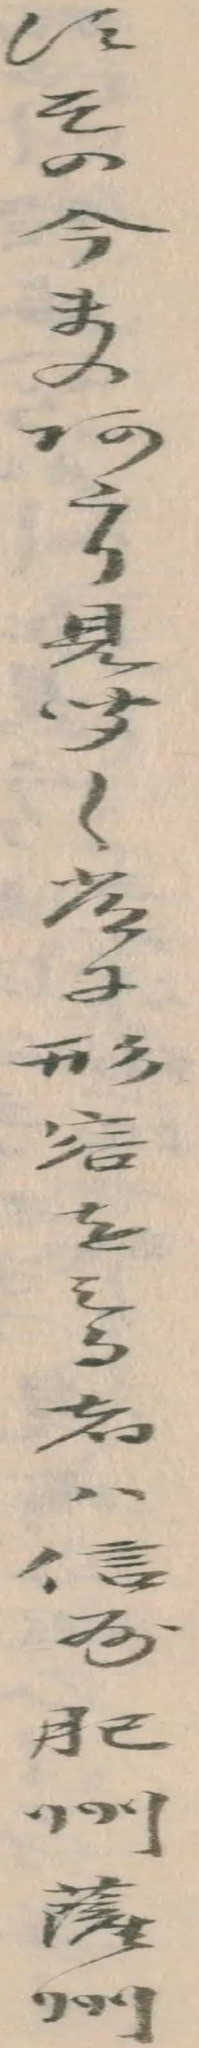すその今まのあたり見聞し常に形容をみる者は信州肥州薩州
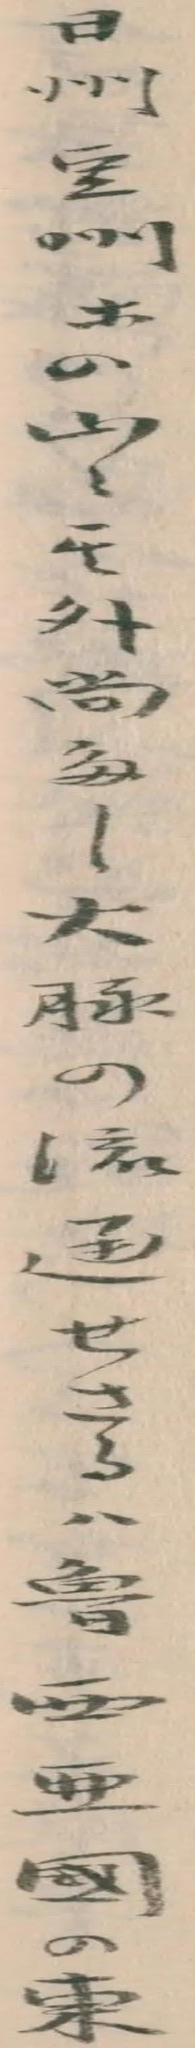日州豆州等の山々其外尚多し火脈の流通せさるは魯西亜国の東
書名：地災撮要. 巻10(地震之部) 上,下
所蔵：国立国会図書館 National Diet Library, JAPAN
